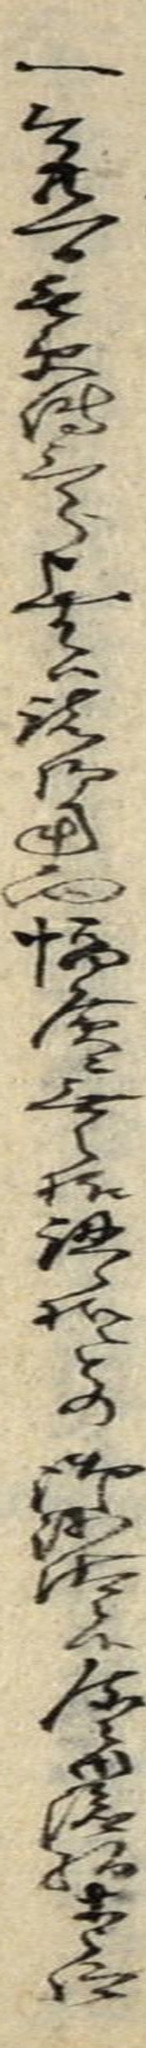一今廿一日毛受伝三郎申聞候は諸御用向幅広に無之様認候様にとの御沙汰に候度々御倹約等被仰
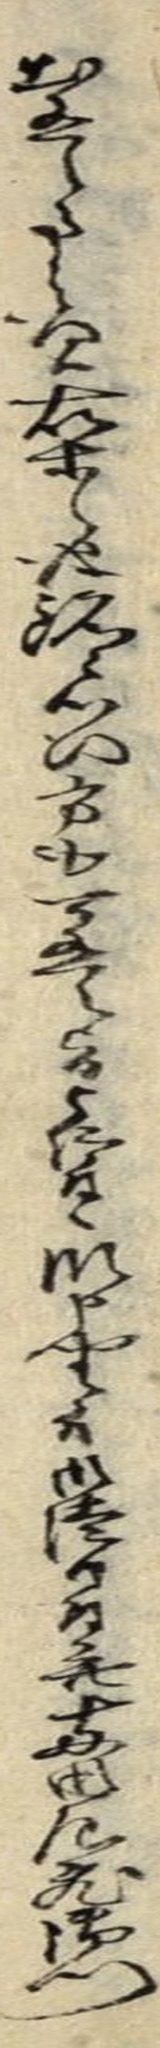出有之候事に候得は右等之儀銘々心得方も可有之旨被仰付候段申聞候に付御徒目付并両御屋敷御門

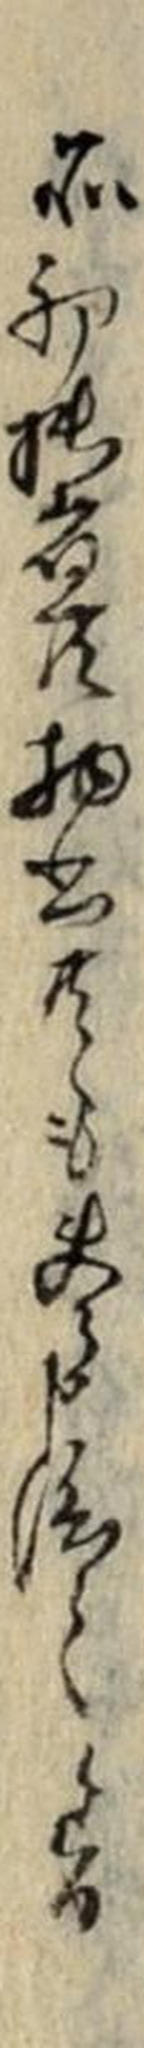所初拙者共物書共へも夫々申渡之候旨
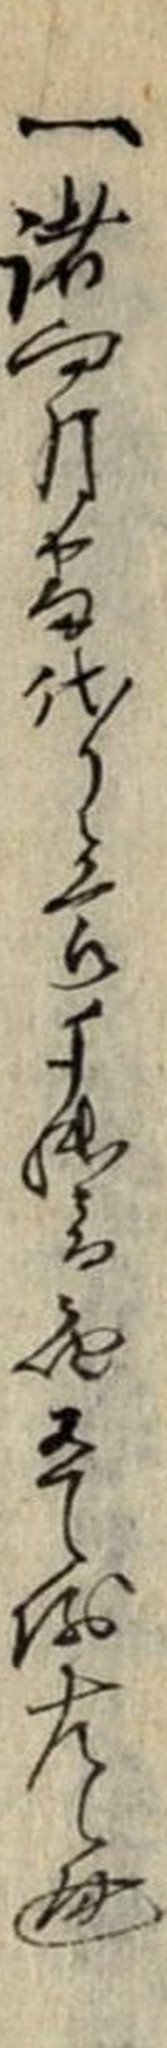一諸向月番代り候節手紙に而届有之例左之通
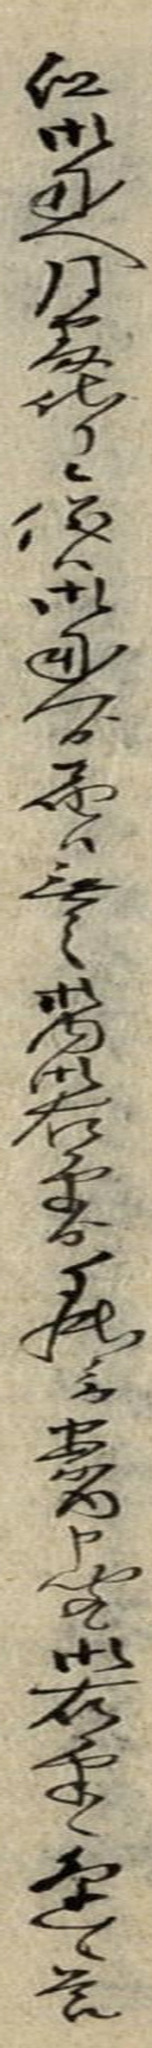但御用人月番代候儀は御用人ゟ届は無之御内御右筆ゟ手紙に而案内申聞御右筆へ届候節
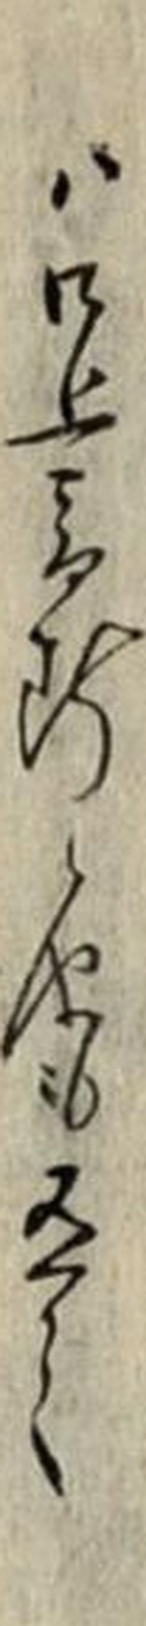は口上に而断之儀も有之
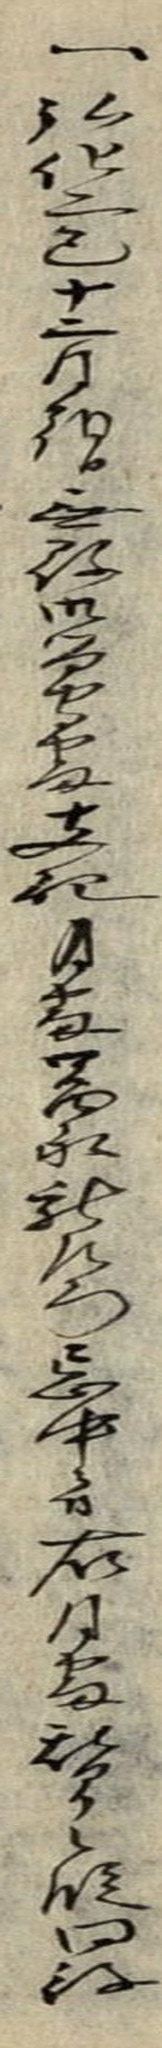一弘化二巳十二月朔日無役御留守番支配月番冨永新左衛門忌中に付右月番替り候段同役
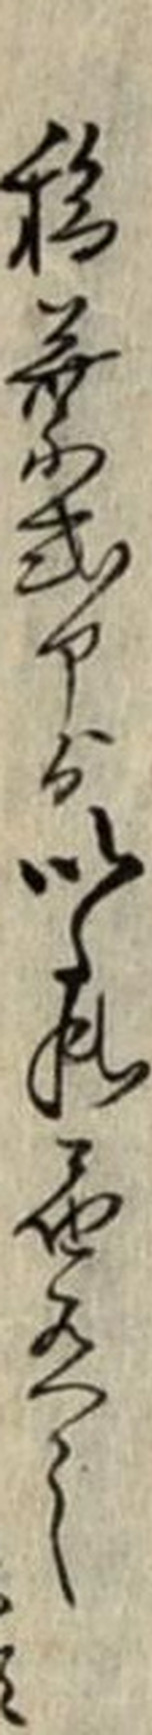稻葉式部ゟ以手紙届有之
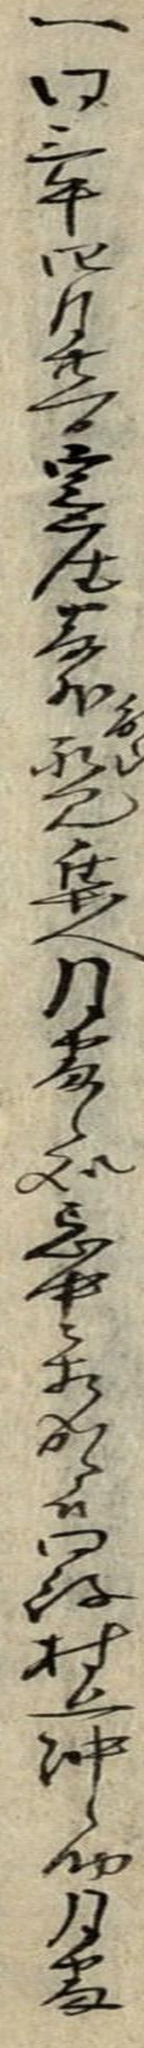一同三午四月廿一日定座番外触頭永見隼人月番之処忌中に相成候に付同役村上沖之助月番
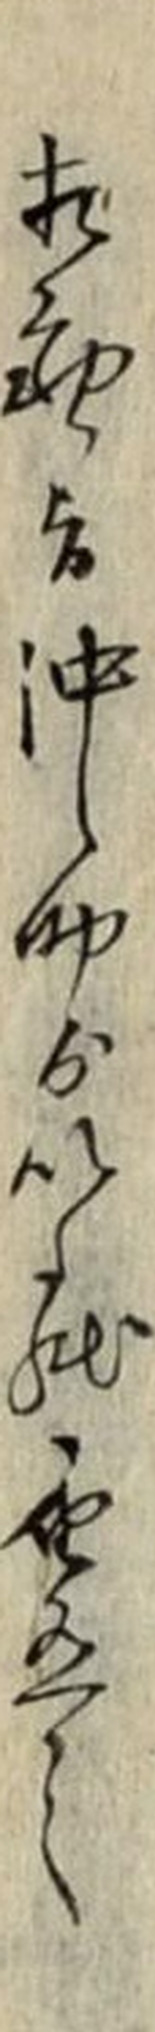相勤候旨沖之助ゟ以手紙届有之
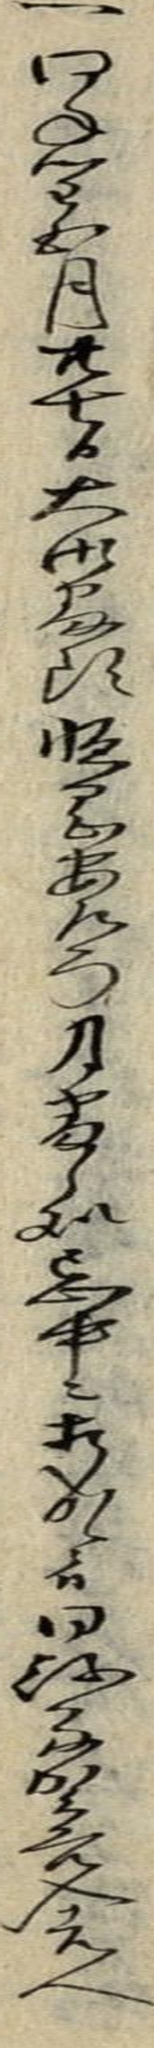一同年閏五月廿七日大御番頭恒岡安左衛門月番之処忌中に相成候に付同役多賀谷舎人
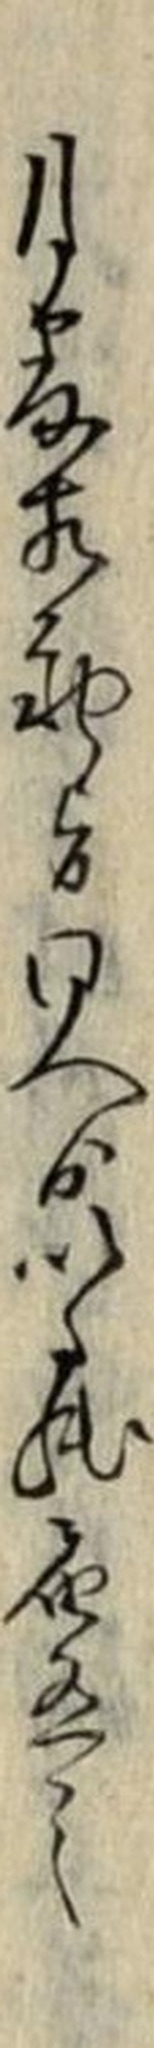月番相勤候旨同人ゟ以手紙届有之
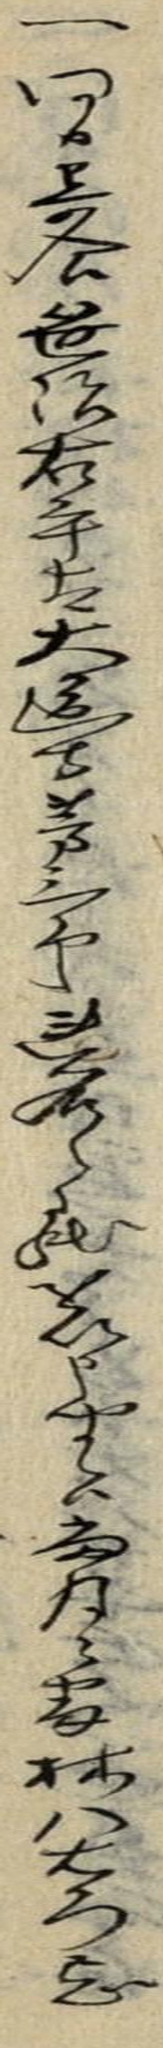一同日寄合笹治右平太大道寺芳三郎連名之手紙を以申聞候は当月々番林八右衛門忌
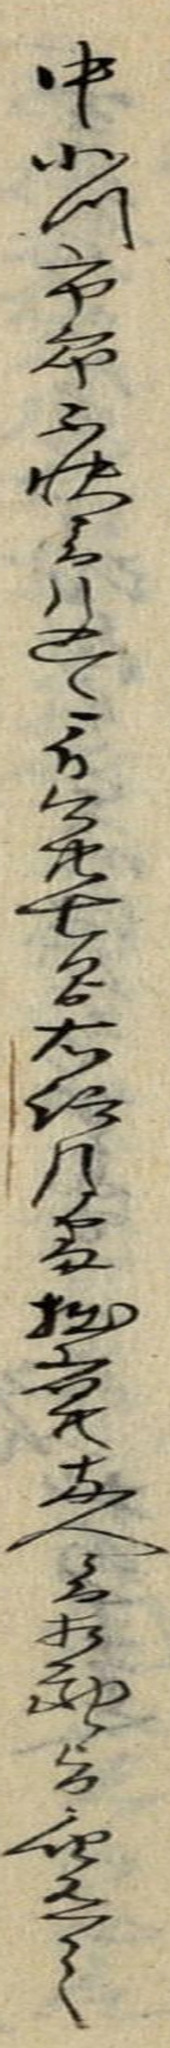中北川市郎不快に而引込候に付今廿七日ゟ右跡月番拙者共両人に而相勤候旨届有之
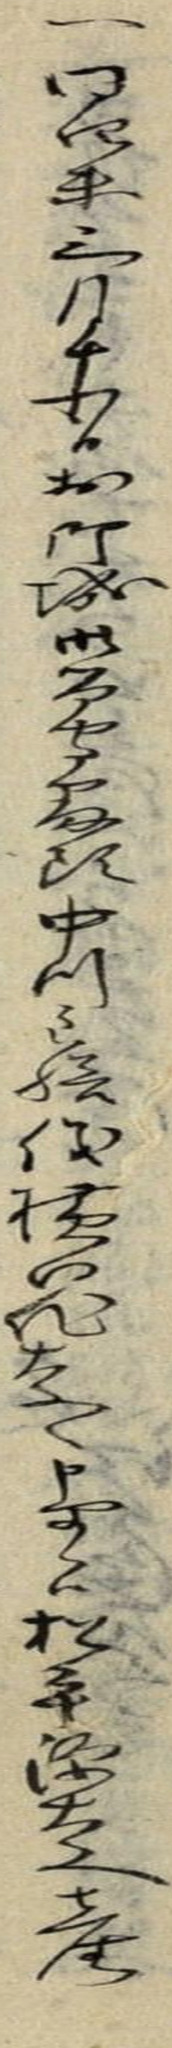一同四未三月十五日於御城御留守番頭中川主膳儀横田作太夫へ申聞候は松平源太夫産
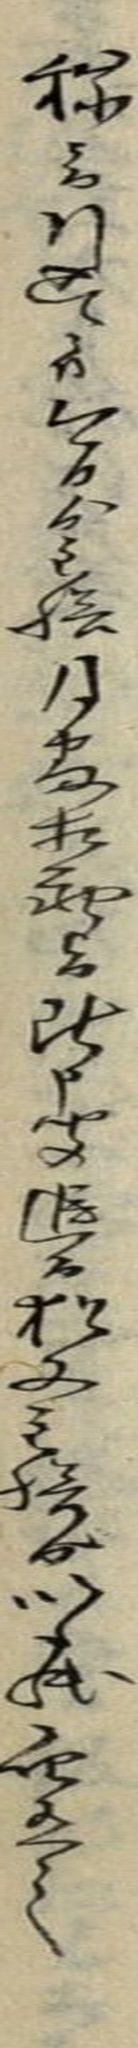穢に而引込候に付今日ゟ主膳月番相勤候旨断申聞追而猶又主膳ゟ以手紙届有之
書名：蒐輯之部
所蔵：福井県文書館 Fukui Prefectural Archives
